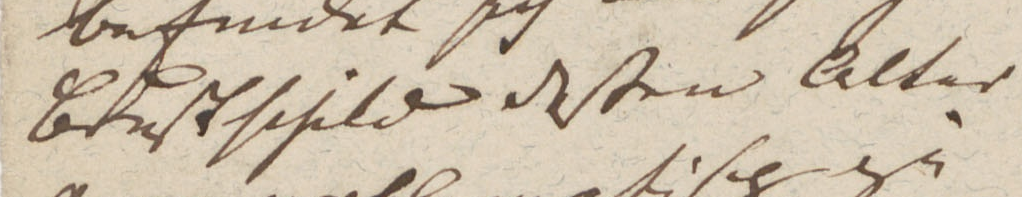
Brustschild dessen Alter
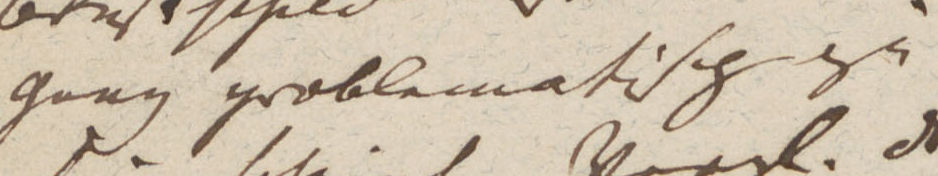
ganz problematisch zu
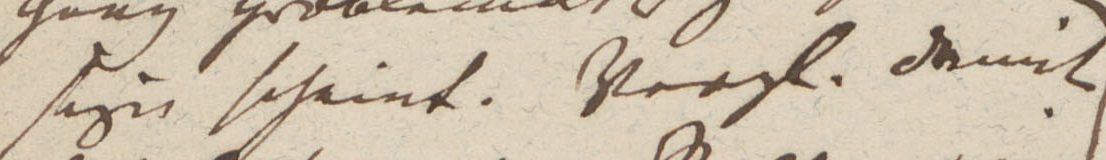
seyn scheint. Vergl. damit
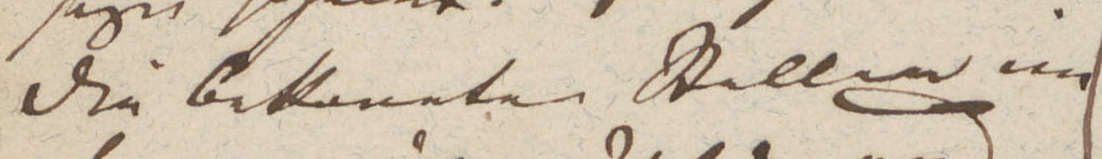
die bekannten Stellen im
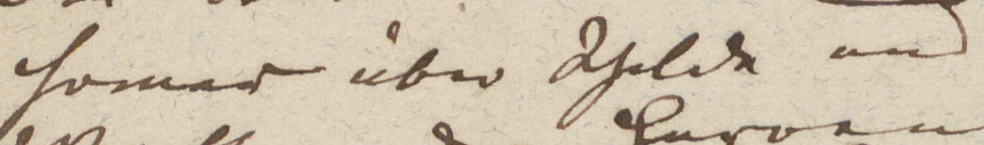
Homer über Schilde und
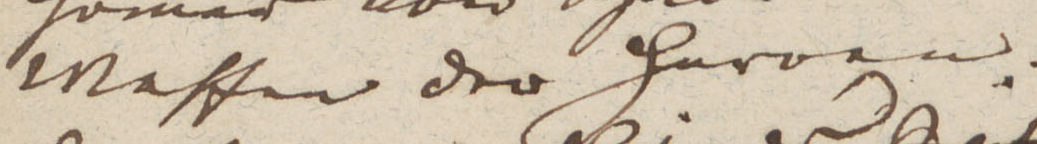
Waffen der Heroen.
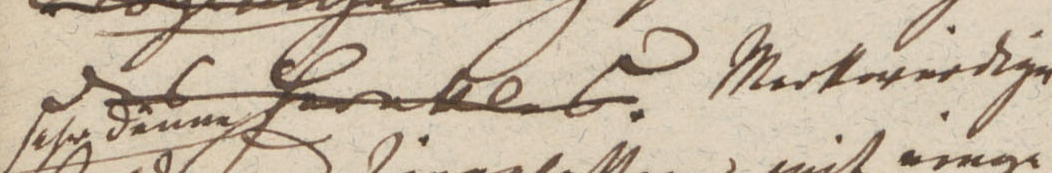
des Herakles. Merkwürdige
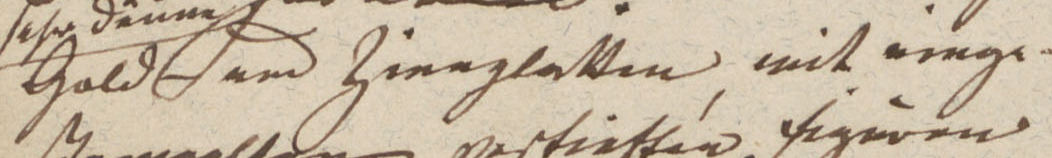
Gold- und Zinnplatten, mit einge-
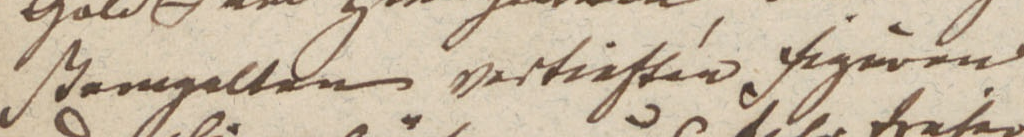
stempelten vertieften Figuren
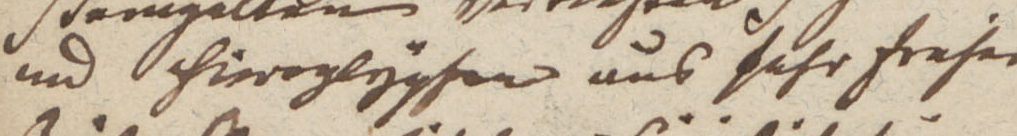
und Hieroglyphen aus sehr früher
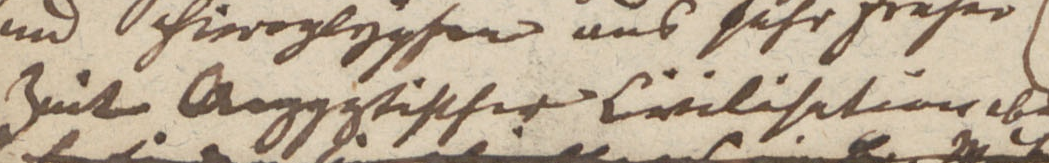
Zeit Aegyptischer Civilisation
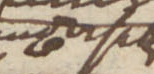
ebendaselbst
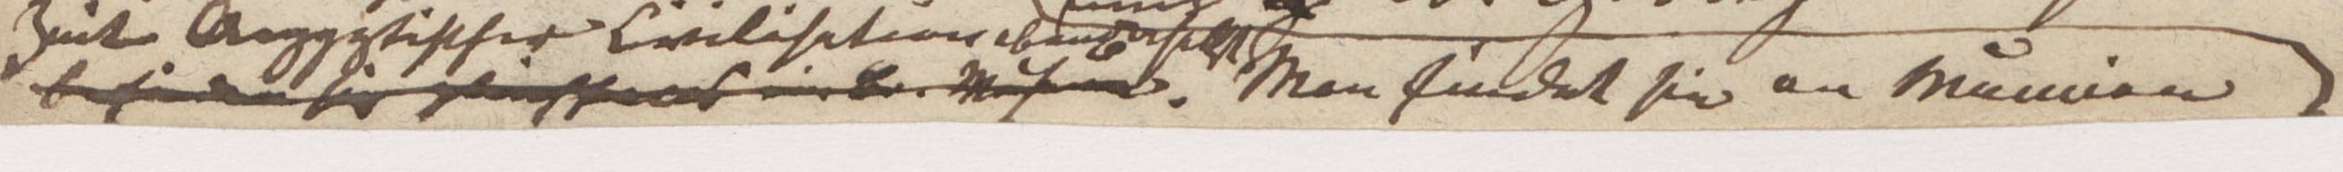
befinden sich gleichfalls im Br. Museum. Man findet sie an Mumien
